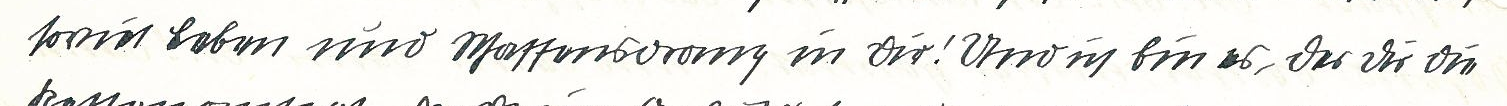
so viel Leben und Schaffensdrang in Dir! Und ich bin es, der Dir die
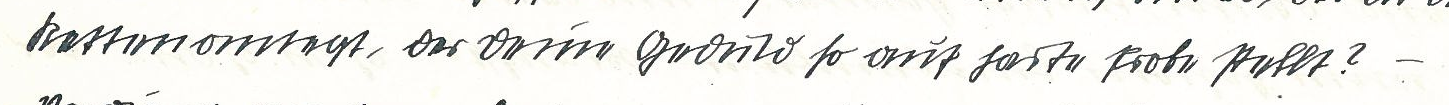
Ketten anlegt, der Deine Geduld auf so harte Probe stellt? –
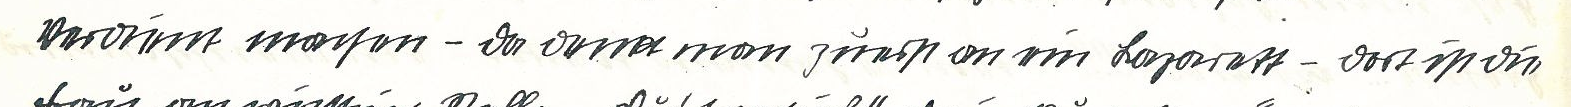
Verdient machen – da denkt man zuerst an ein Lazarett – dort ist die
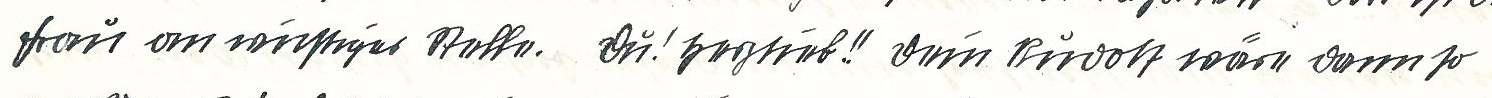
Frau an wichtiger Stelle. Du! Herzlieb!! Dein Rudolf wäre dann so
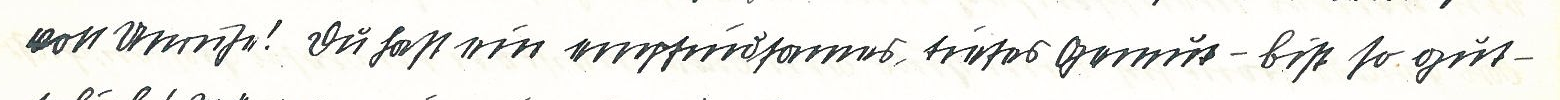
voll Unruhe! Du hast ein empfindsames, tiefes Gemüt – bist so gut
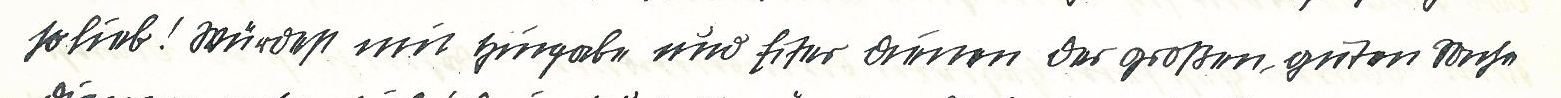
– so lieb! Würdest mit Hingabe und Eifer dienen der großen, guten Sache
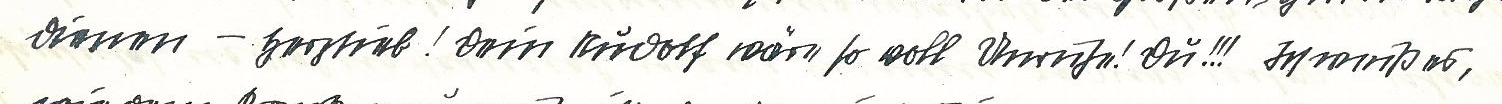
dienen – Herzlieb! Dein Rudolf wäre so voll Unruhe! Du!!! Ich weiß es,
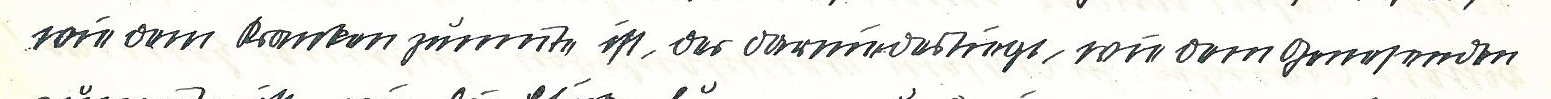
wie dem Kranken zumute ist, der darniederliegt, wie dem Genesenden
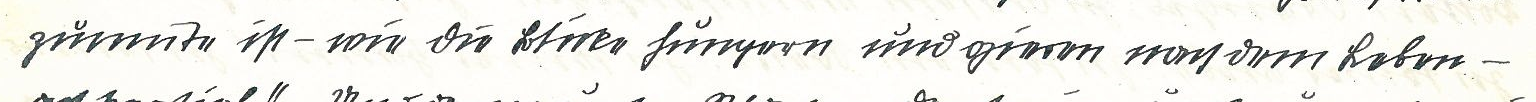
zumute ist – wie die Blicke hungern und gieren nach dem Leben –
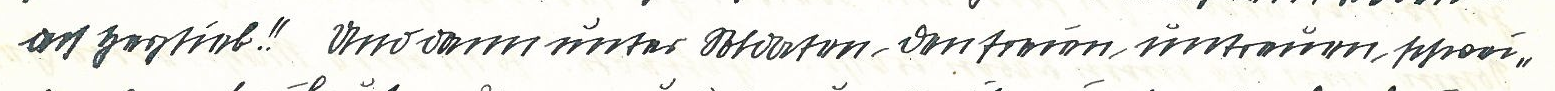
ach Herzlieb!! Und dann unter Soldaten, den freien, untreuen, schwei¬
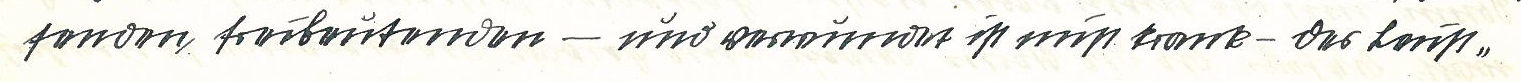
fenden, freibeutenden – und verwundet ist nicht krank – der Leicht¬
